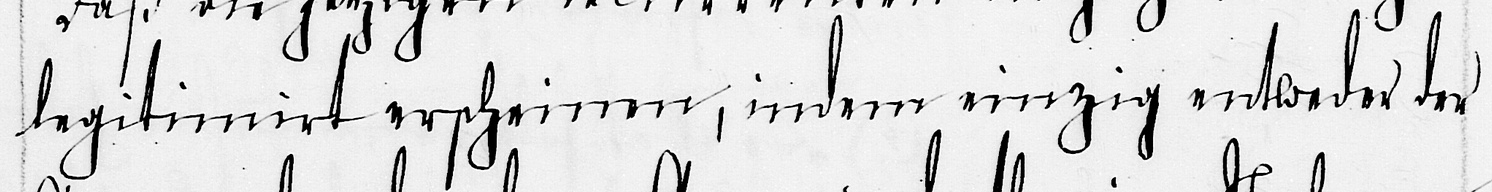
legitimirt erscheinen, indem einzig entweder der
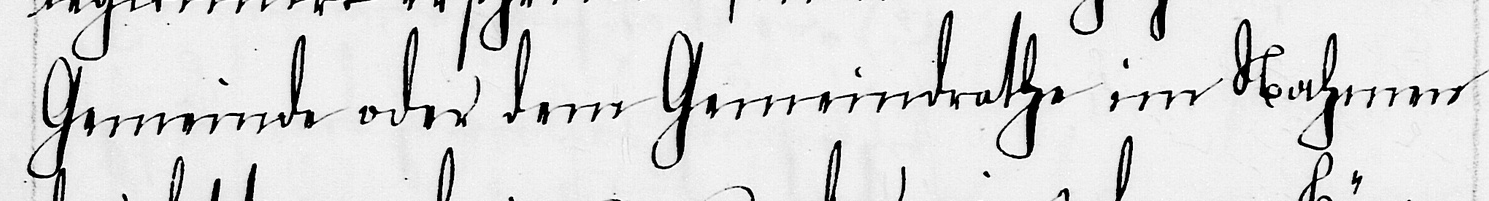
Gemeinde oder dem Gemeindrathe im Nahmen
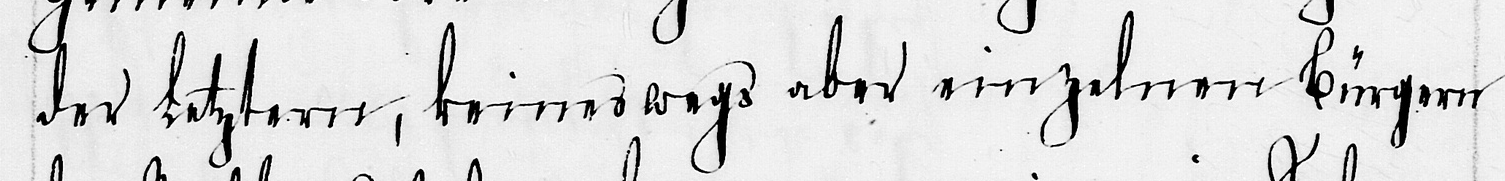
der Letztern, keineswegs aber einzelnen Bürgern
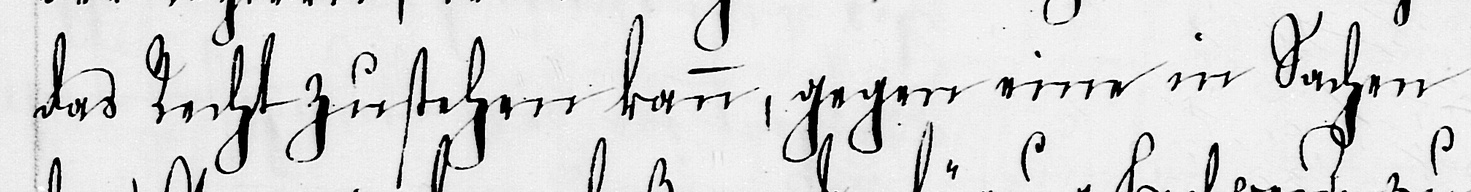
das Recht zustehen kann, gegen eine in Sachen
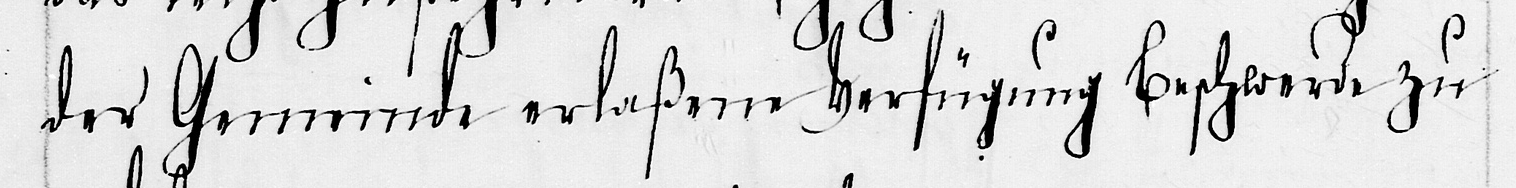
der Gemeinde erlaßene Verfügung Beschwerde zu
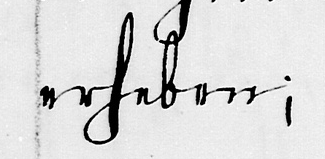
erheben;
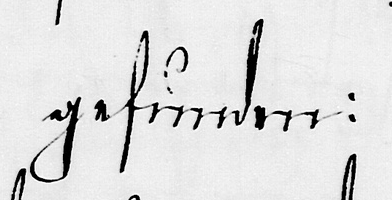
gefunden:
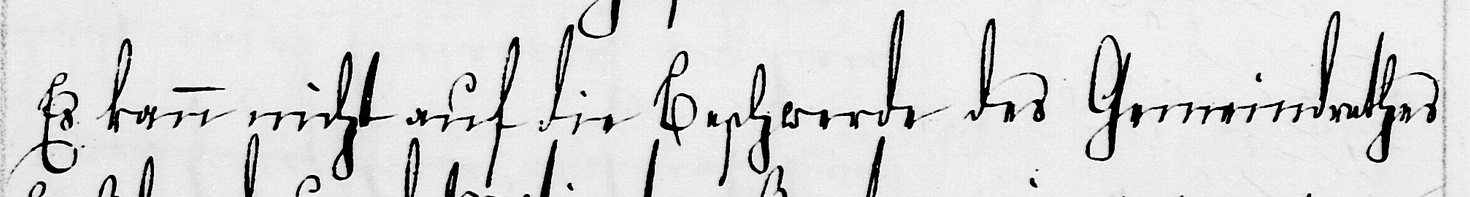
Es kann nicht auf die Beschwerde des Gemeindrathes
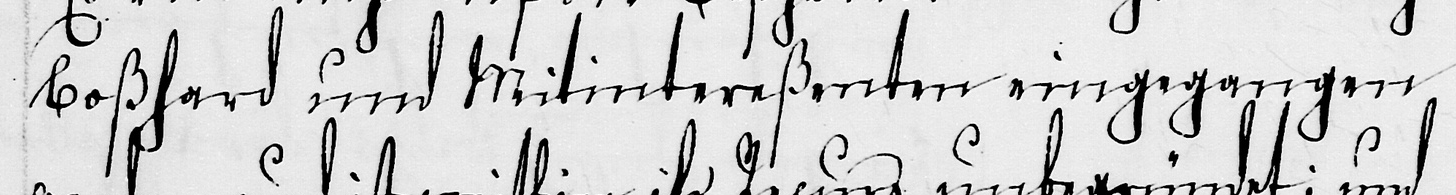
Boßhard und Mitintereßenten eingegangen
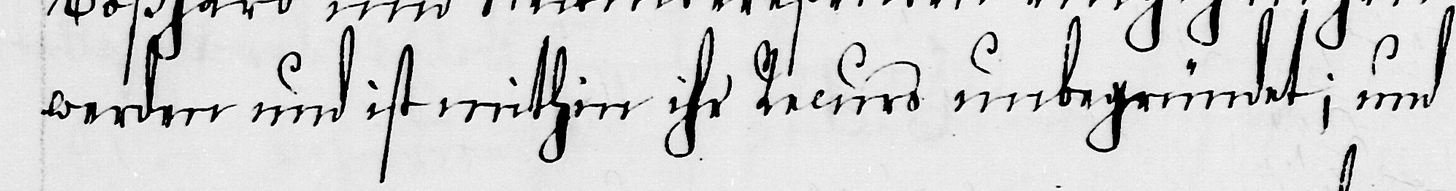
werden und ist mithin ihr Recurs unbegründet; und
